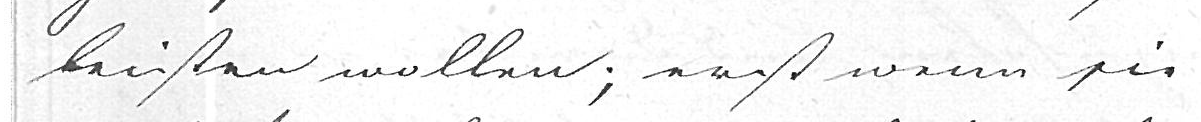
leisten wollen; erst wenn sie
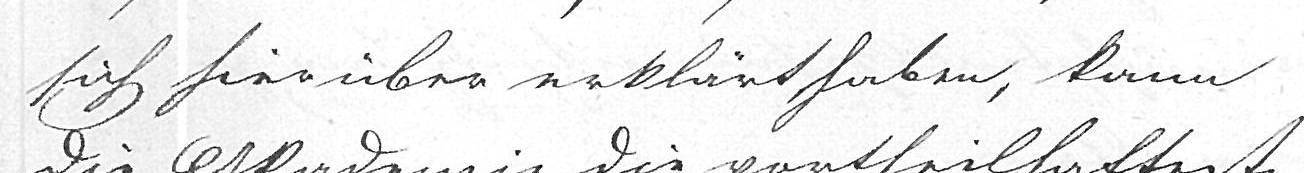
sich hierüber erklärt haben, kann
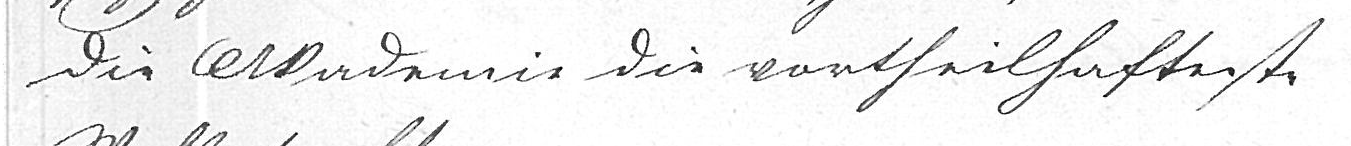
die Akademie die vortheilhafteste
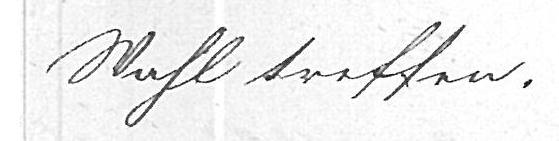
Wahl treffen.
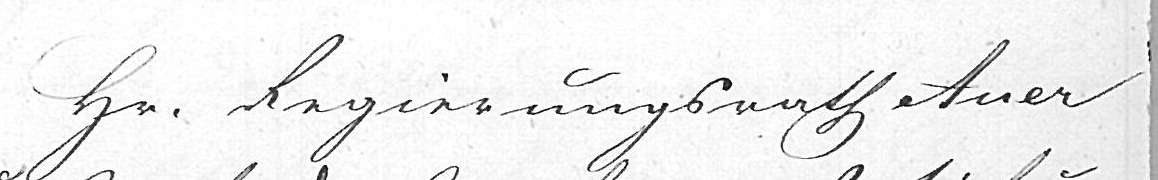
Hr. Regierungsrath Auer
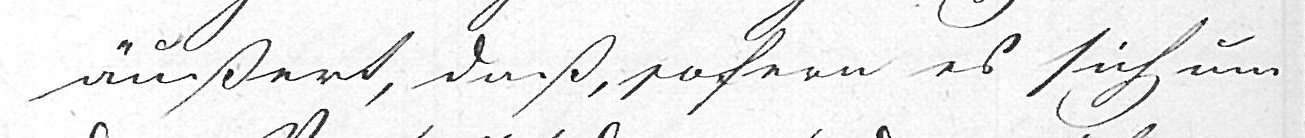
äußert, daß, sofern es sich um
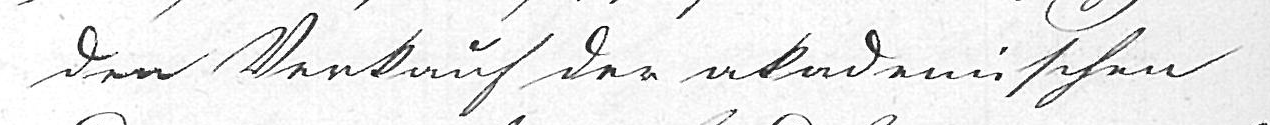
den Verkauf der akademischen
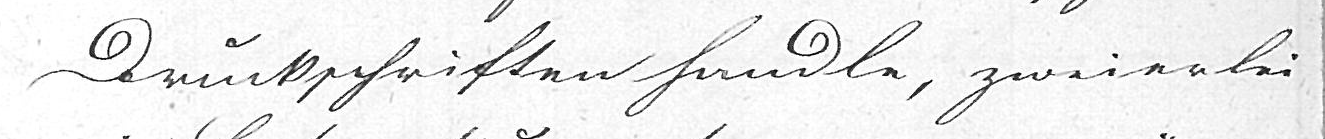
Druckschriften handle, zweierlei
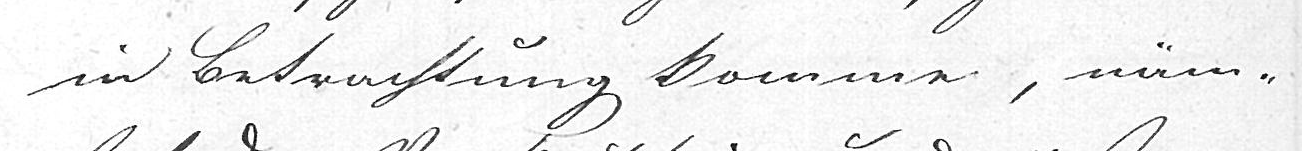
in Betrachtung komme, näm-
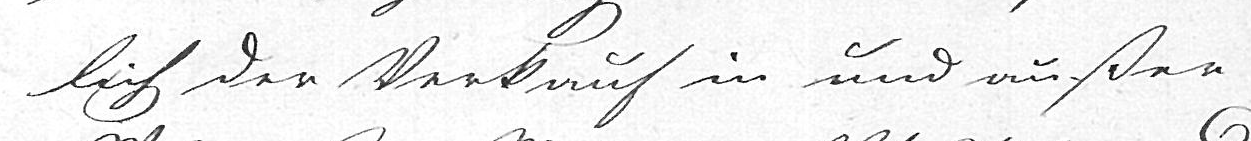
lich der Verkauf in und außer
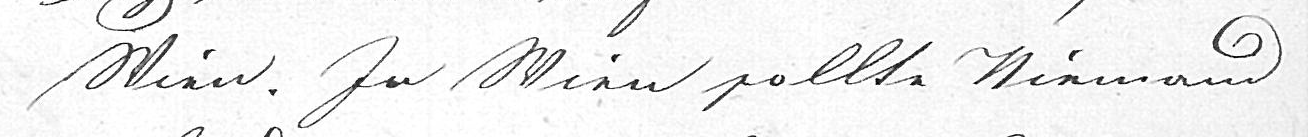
Wien. In Wien sollte Niemand
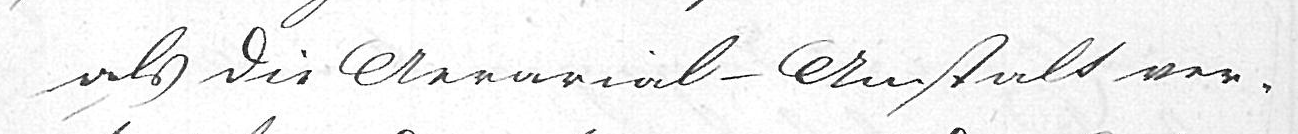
als die Aerarial-Anstalt ver-
